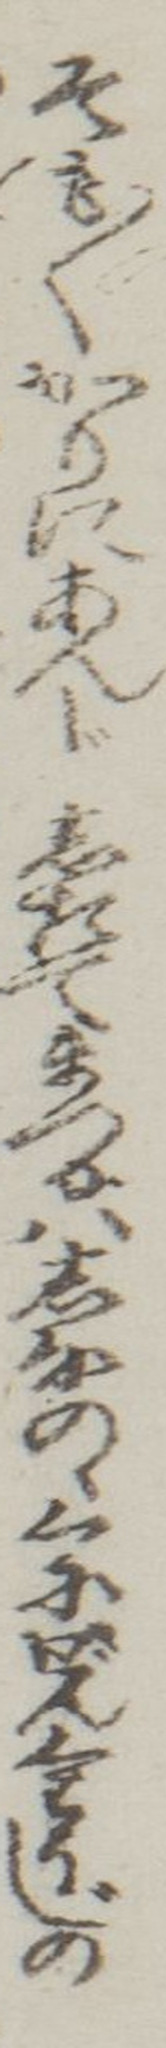そも〳〵かりにあんじしたてまつるはしなのゝくにぜんくわうじの
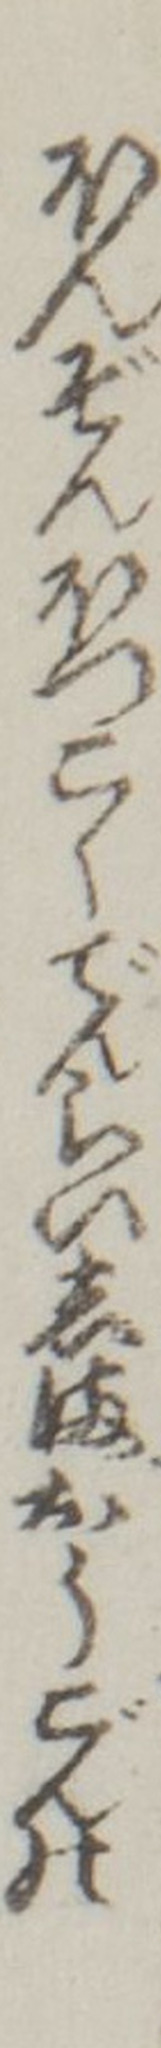ほんぞんほつこくでんらいしまおうごんの
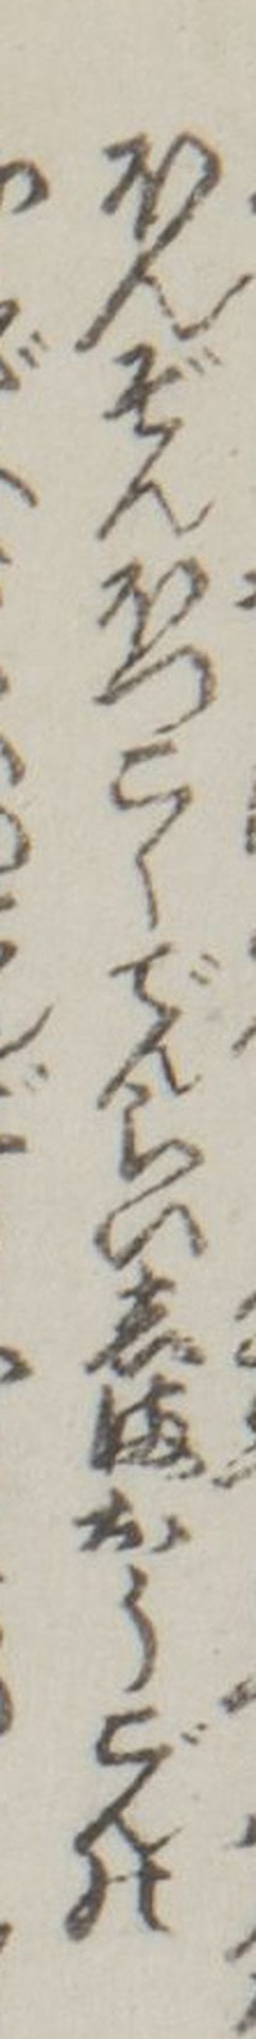ほんぞんほつこくでんらいしまおうごんの
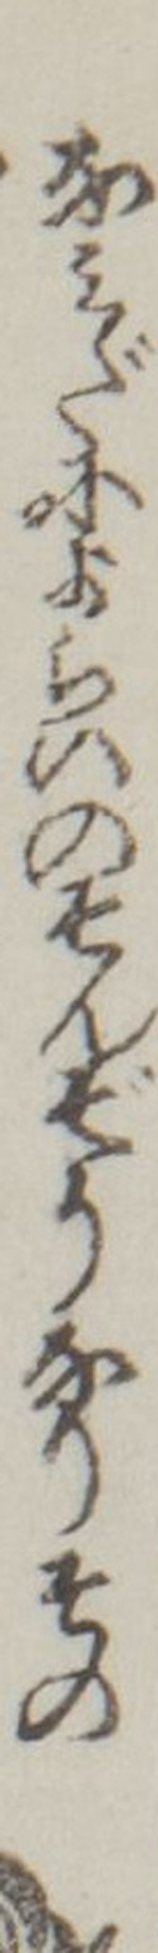なみだによらいのそんぞうなりその
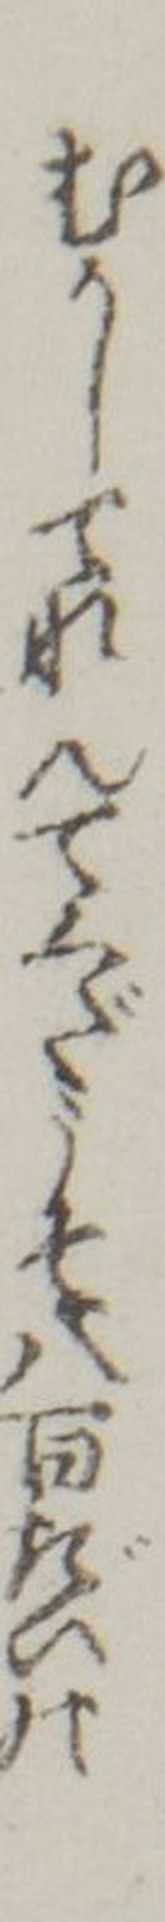むかしてれんてくだうそ八百だいの
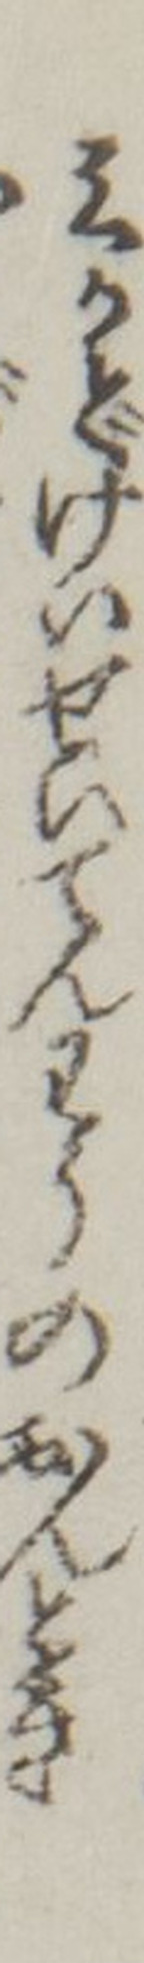みかどけいせいてんわうのおんとき
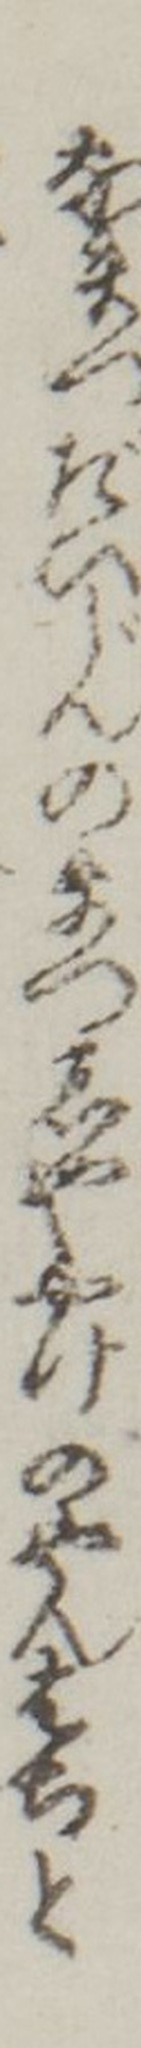なまづだいじんのまつしややけのやんはちと
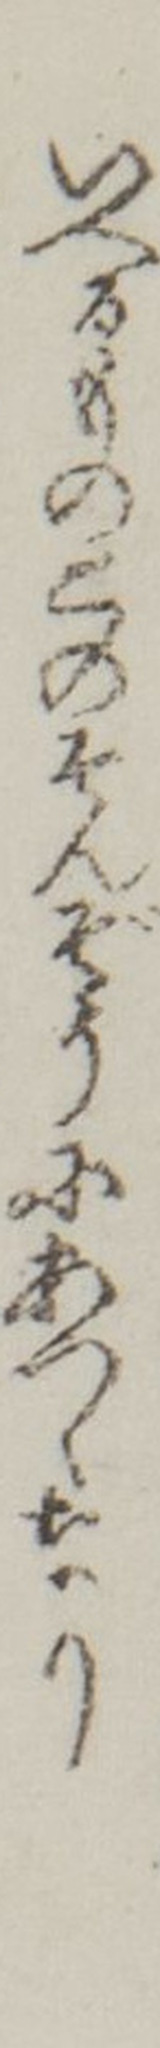いへるものこのそんぞうにあつくなり
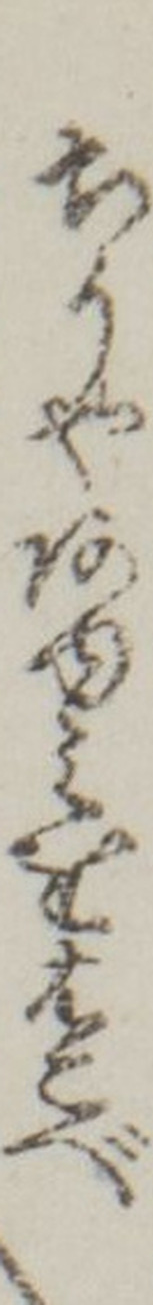ちうやあゆみをはこべ
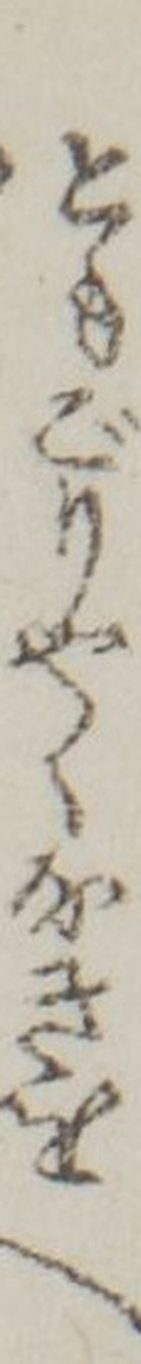ともごりやくなきを
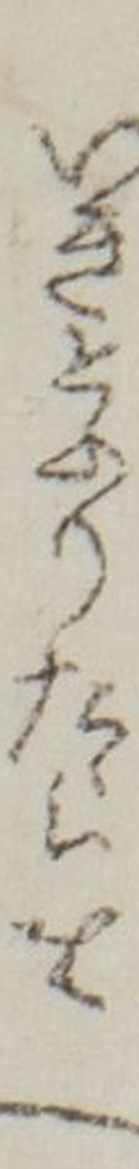いきとふりたゝらを
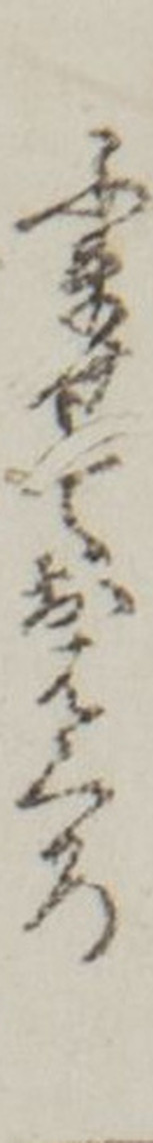ふませておはくろ
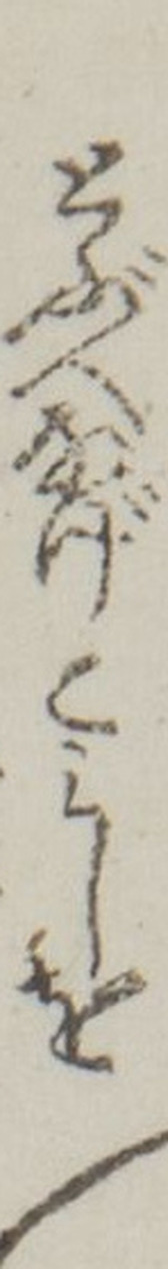とぶへなげこみしを
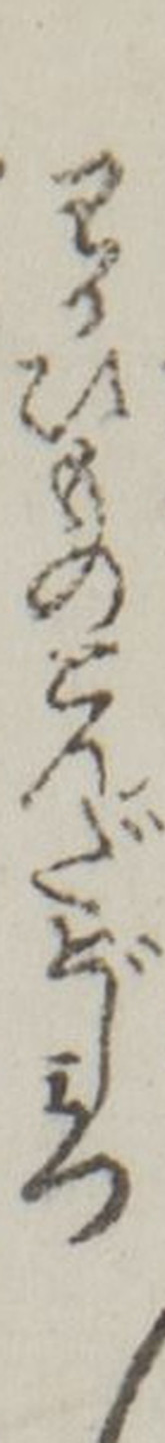わかひものとんだどしみつ
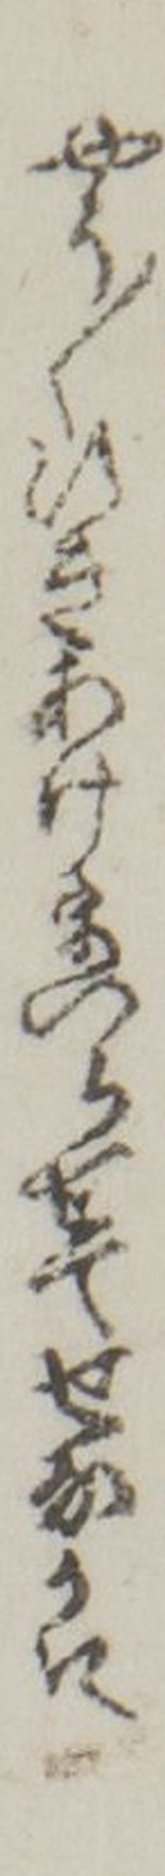やう〳〵ひきあけまいらせてせなかに
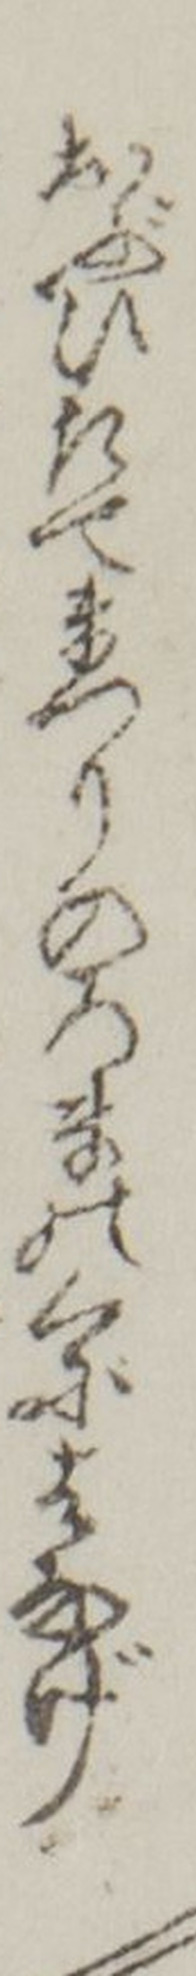おぶひたてまつりのろまのくにはなげ
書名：泪如来の損像
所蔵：あいおいニッセイ同和損保株式会社
